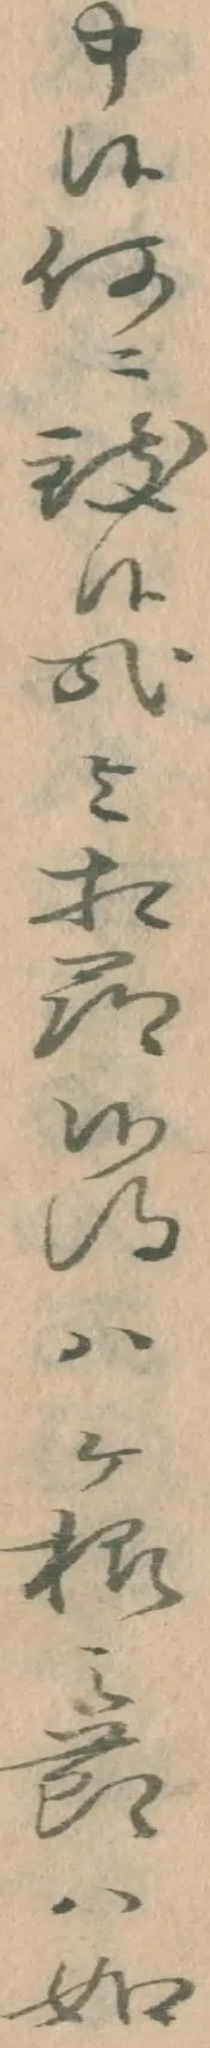申候何に致候哉与相尋候得はけ様之節は如

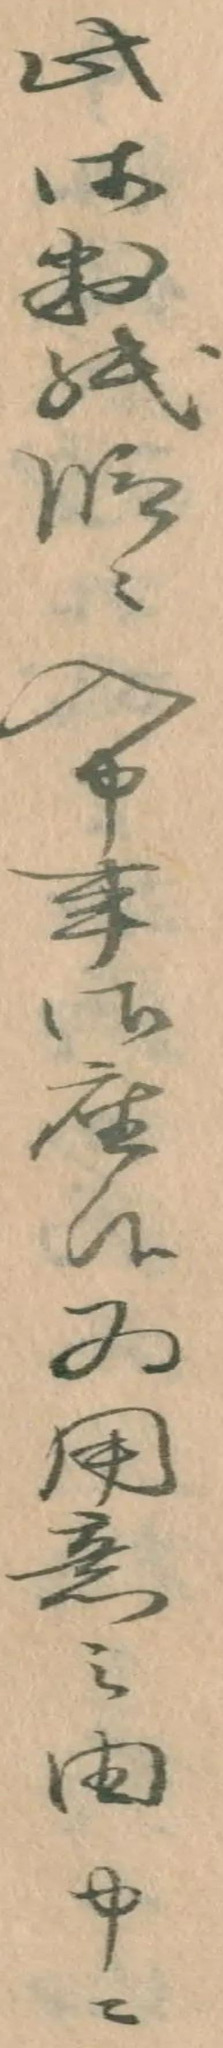此御判紙段々入申事御座候ゐ用意之由申に
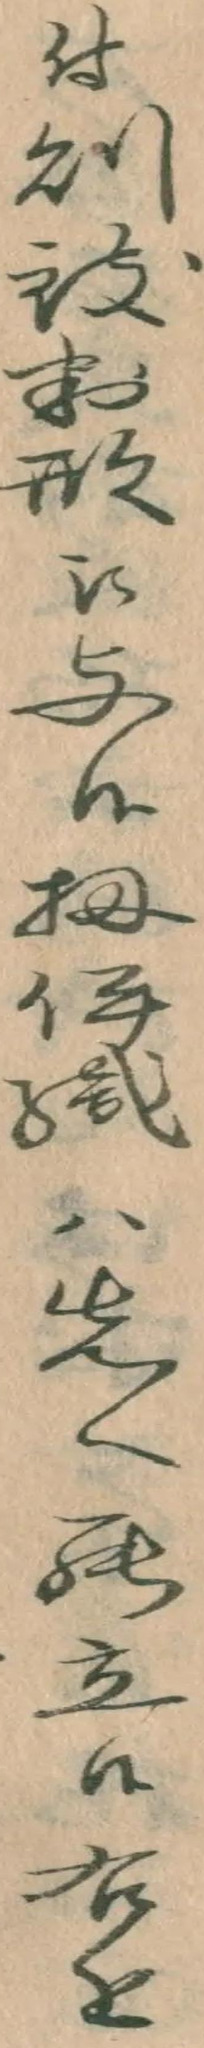付則致判形被与候扨伊織は先へ罷立候右近
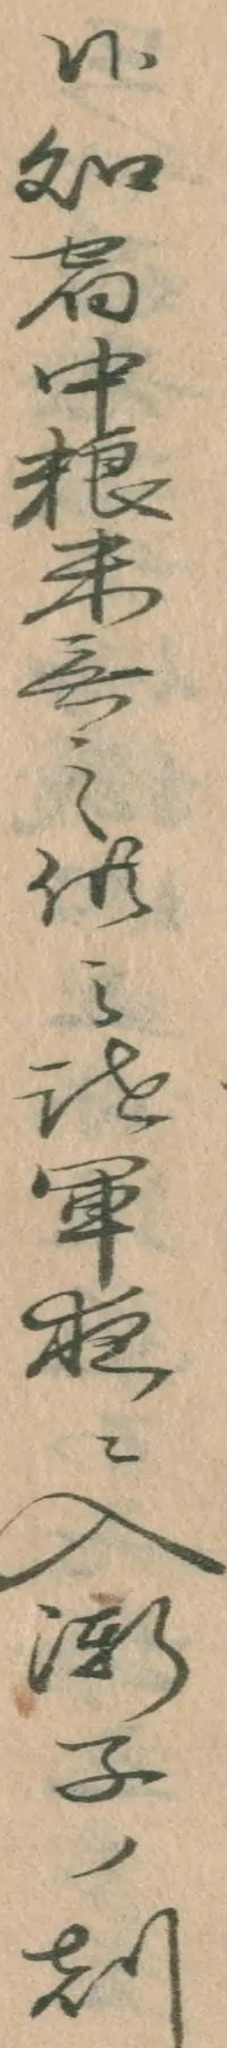候処宿中粮米無之供之諸軍夜に入漸子之刻
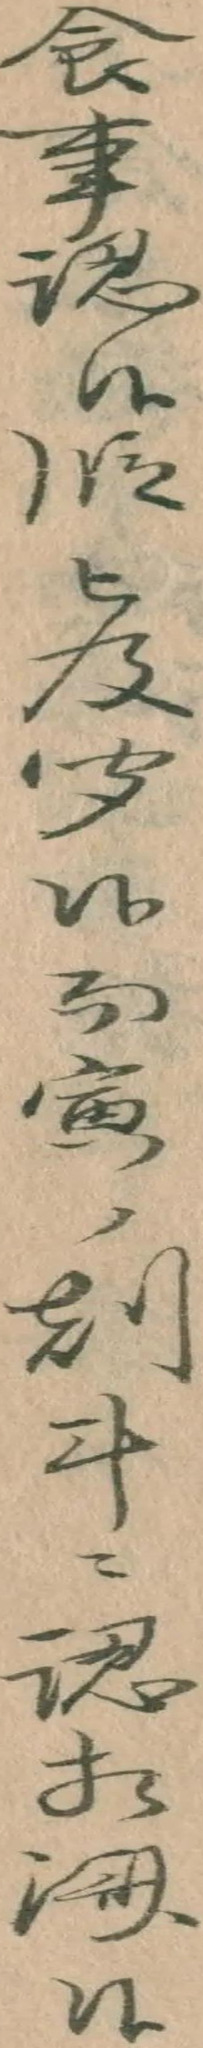食事認候段被及聞候而寅之刻斗に認相済候
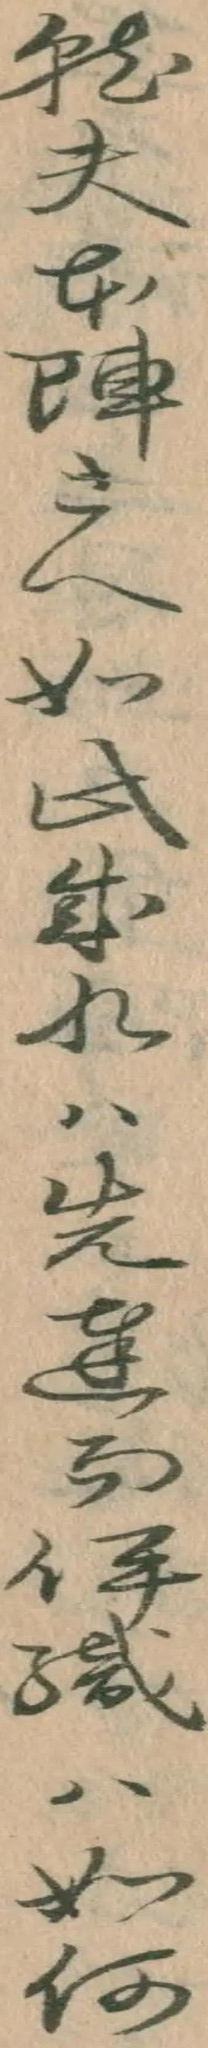就夫本陣さへ如此成れは先達而伊織は如何
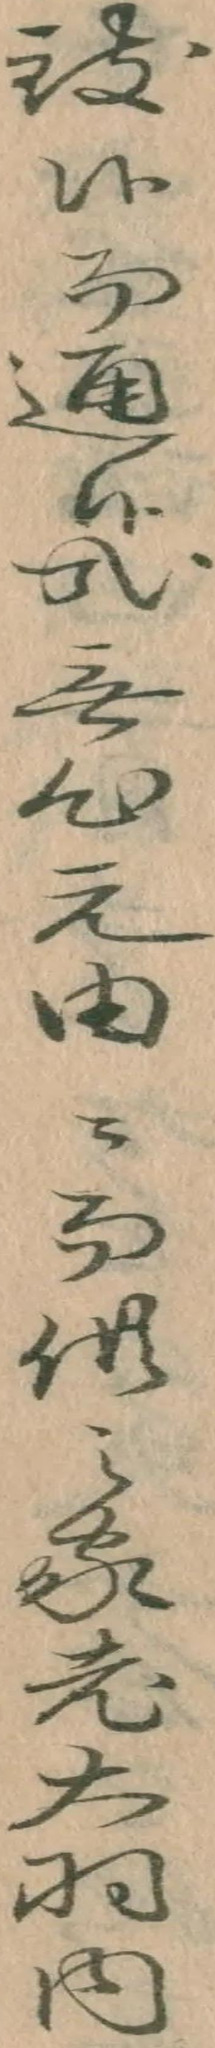致候而通候哉無心元由に而供之家老大羽内
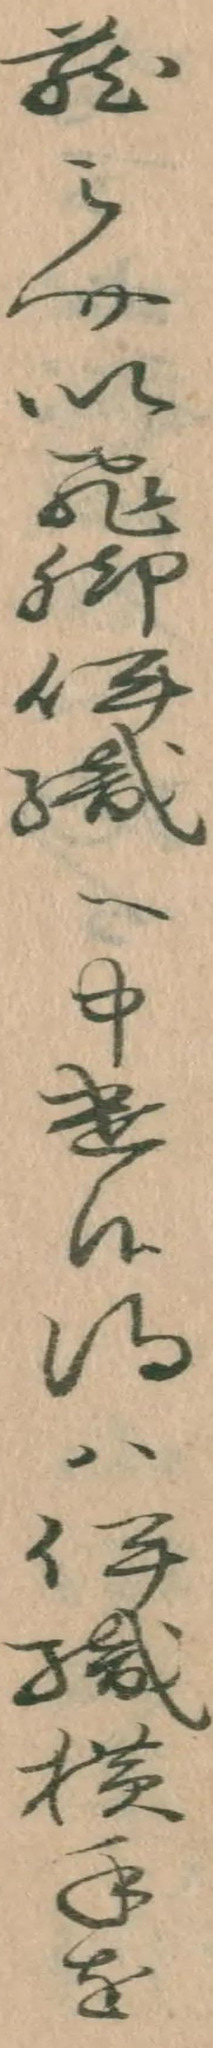蔵之介以飛脚伊織へ申遣候得は伊織横手を
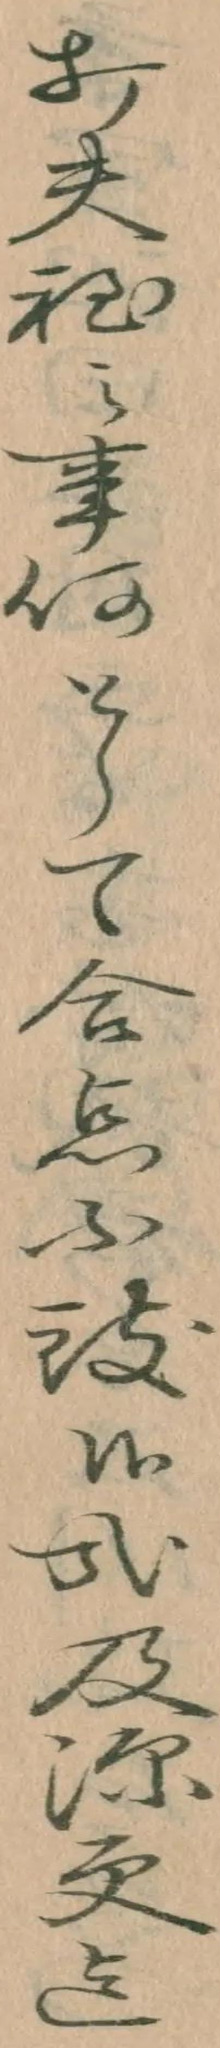打夫程之事何として合点ふ致候哉及深更迄
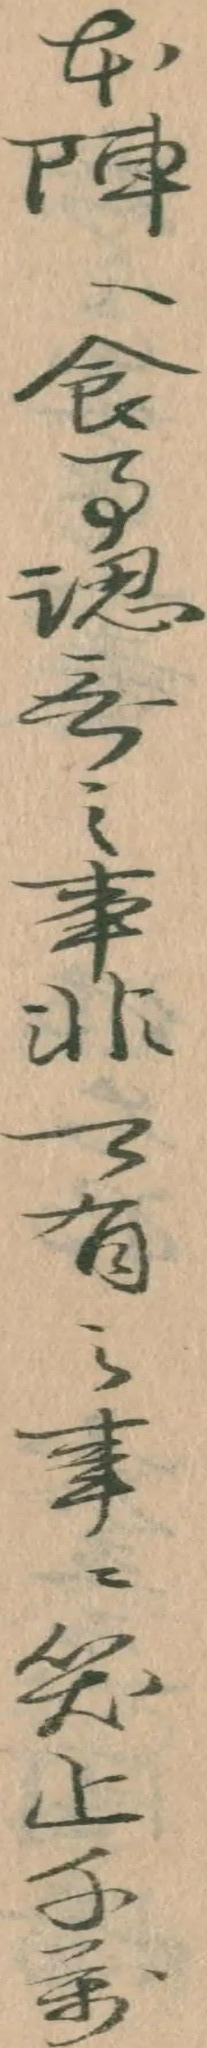本陣へ食事認無之事非可有之事に笑止千万
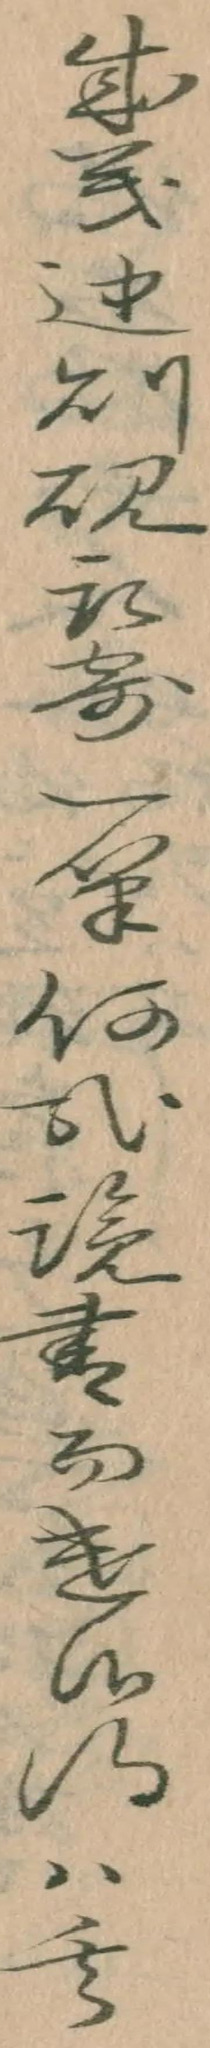成義迚則硯取寄一筆何哉覧書而遣候得は其
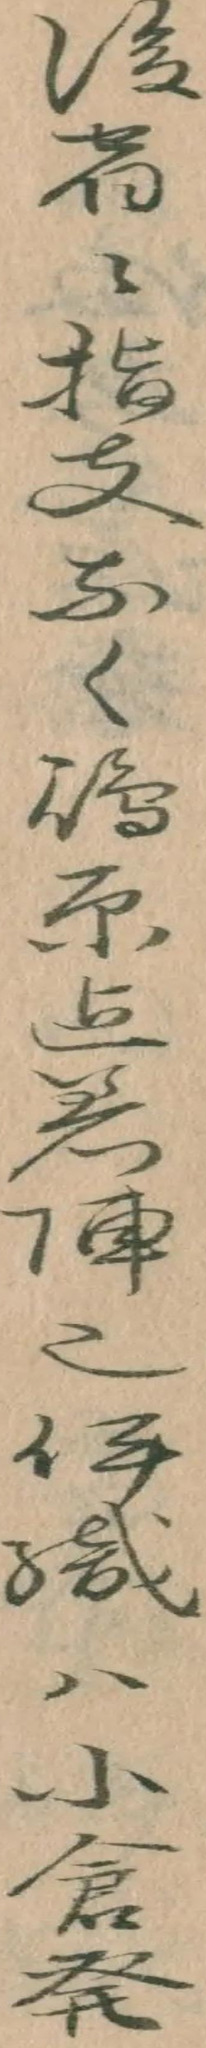後宿に指支なく島原迄着陣也伊織は小倉発
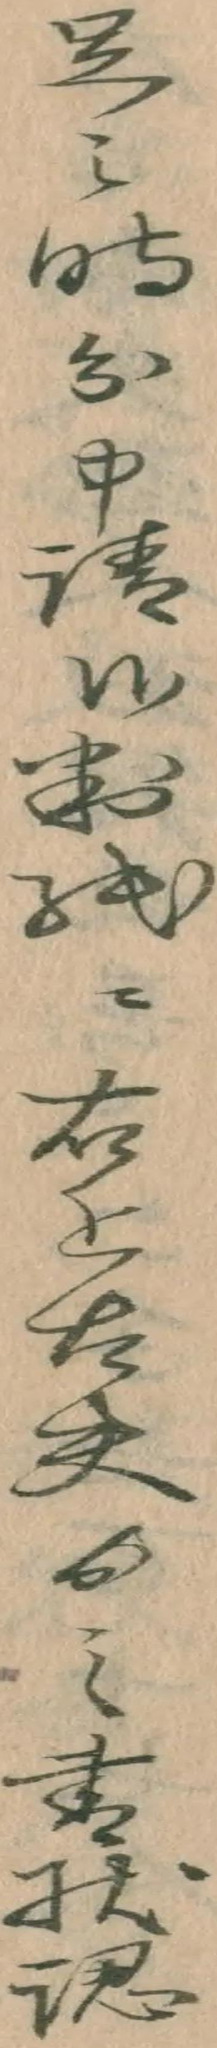足之時分申請候判紙に右近太夫ゟ之書状認
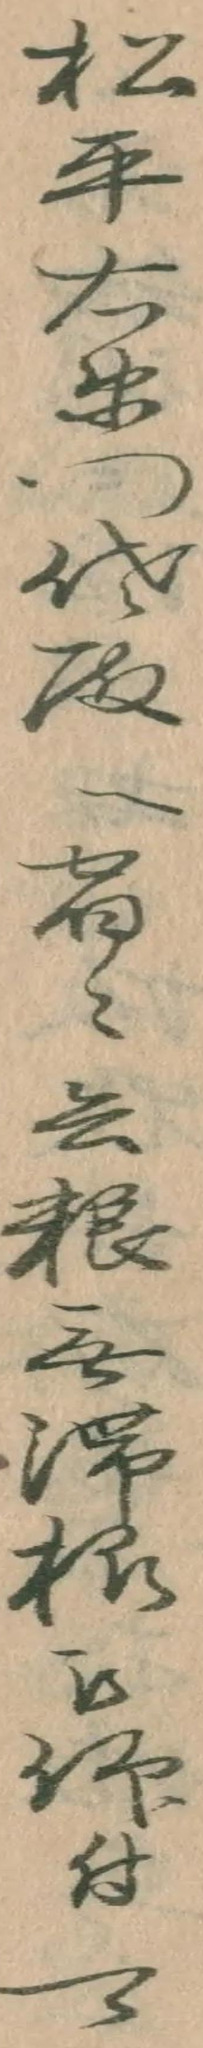松平右衛門佐殿へ宿に兵粮無滞様非仰付可
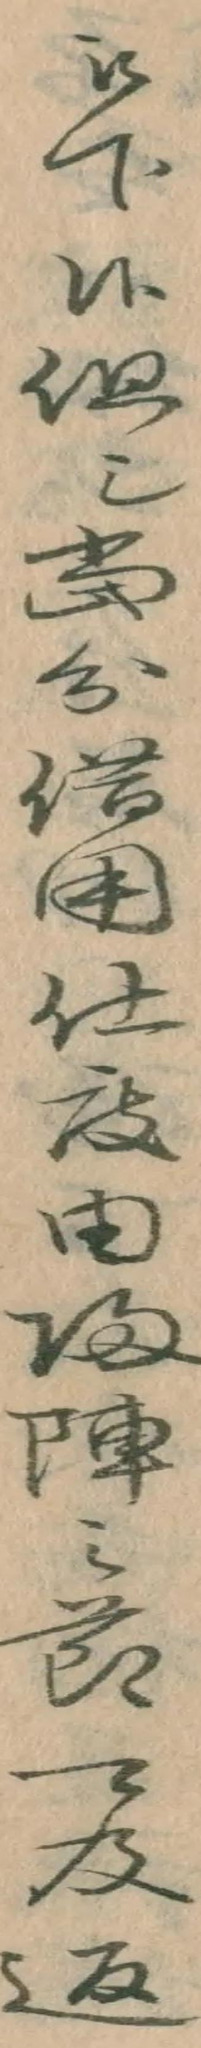被下候但し当分借用仕度由帰陣之節可及返
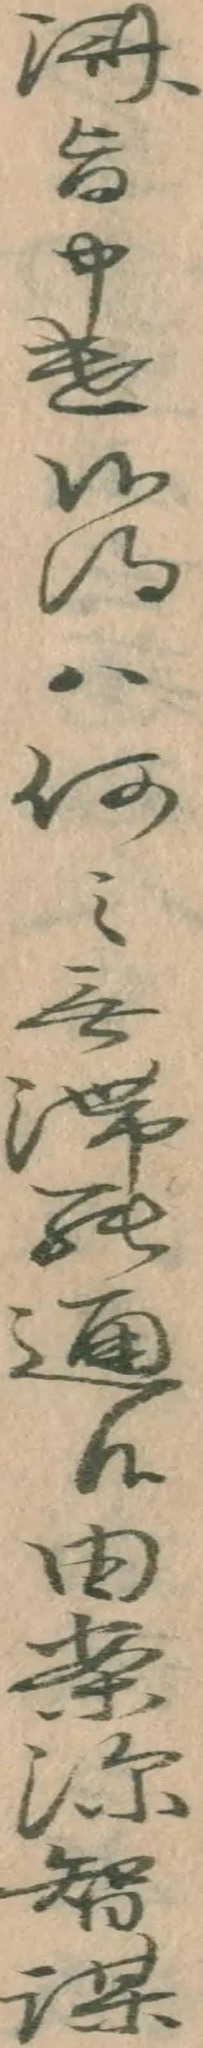済旨申遣候得は何之無滞罷通候由案深智謀
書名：切支丹御退治記 49巻. [6]
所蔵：国立国会図書館 National Diet Library, JAPAN
